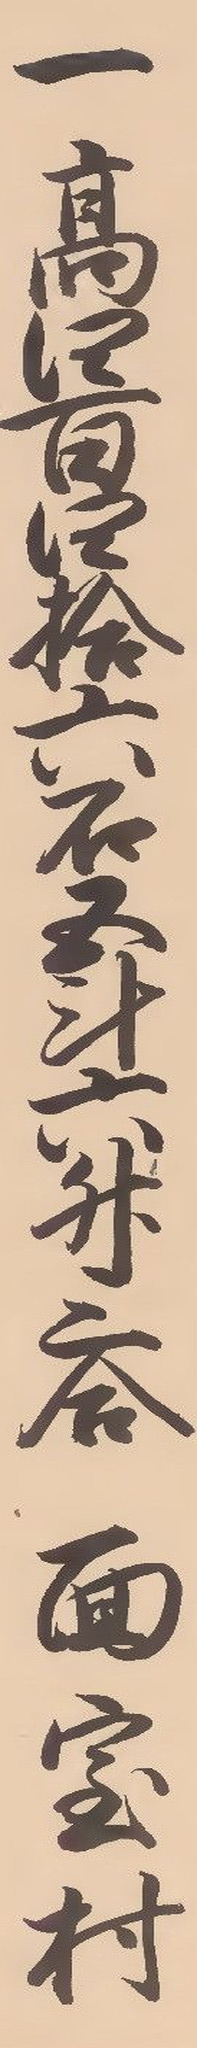一髙四百四拾六石五斗六升三合面室村
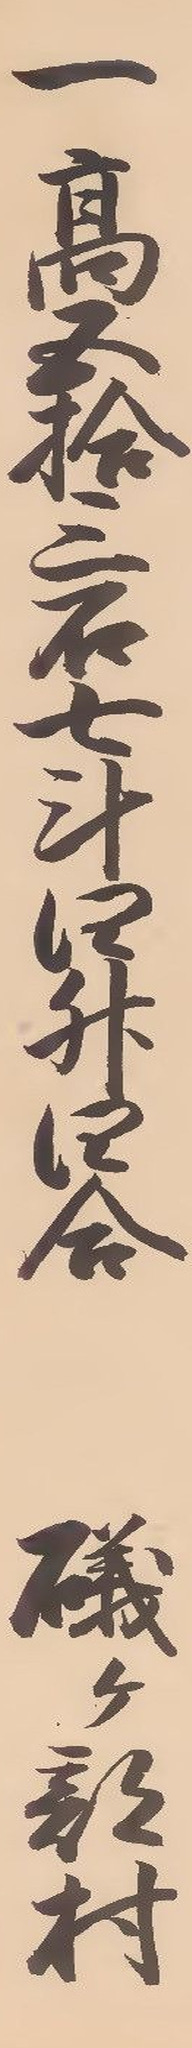一髙五拾三石七斗四升四合磯ケ部村

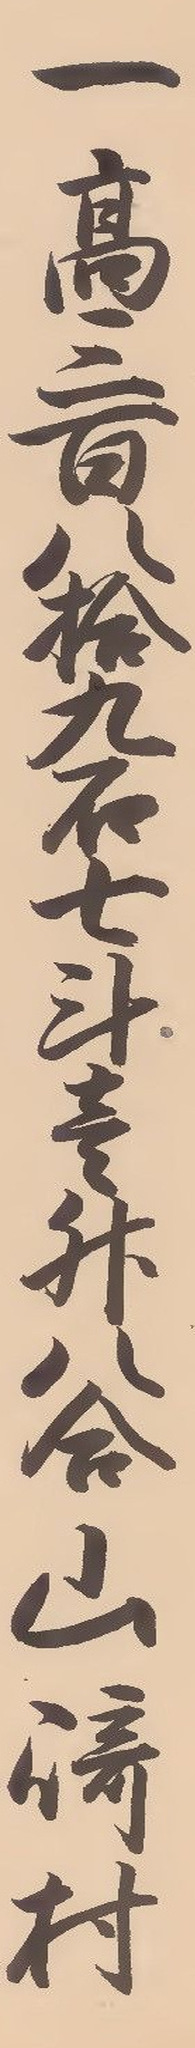一髙三百八拾九石七斗壱升八合山崎村
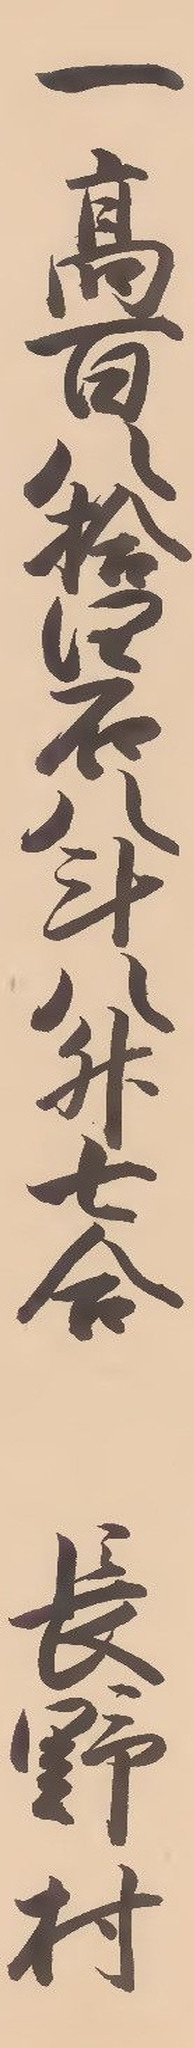一髙百八拾四石八斗八升七合長野村
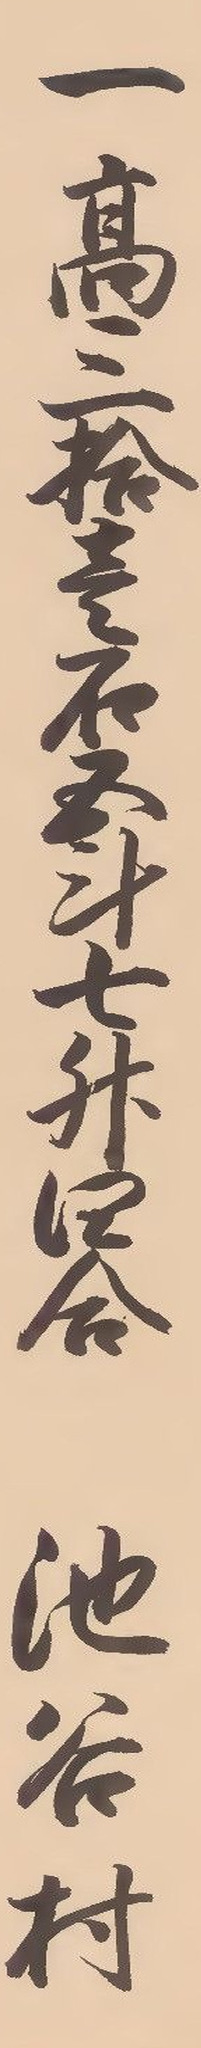一髙三拾壱石五斗七升四合池谷村
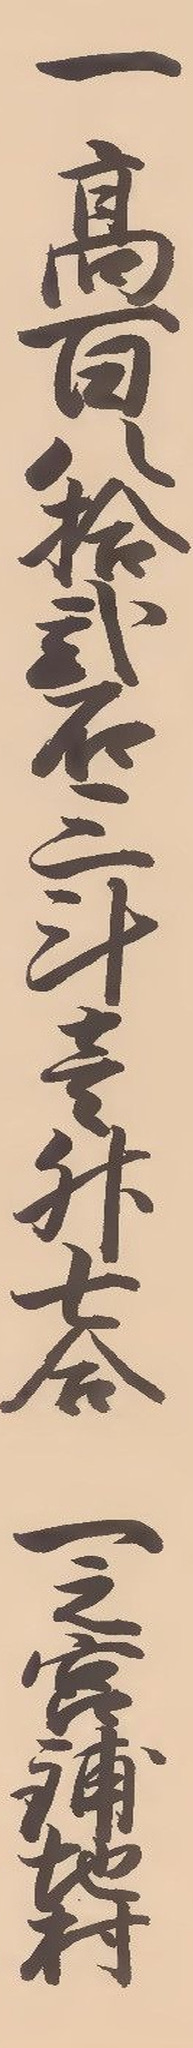一髙百八拾弐石三斗壱升七合一之宮地村
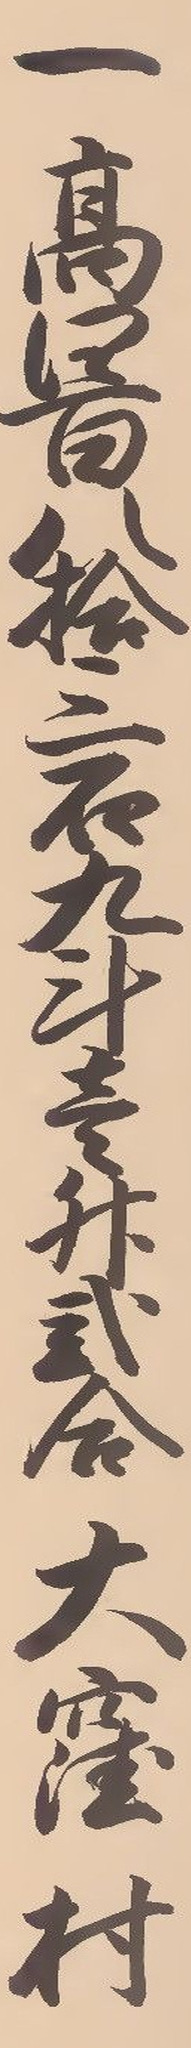一髙四百八拾三石九斗壱升弐合大窪村
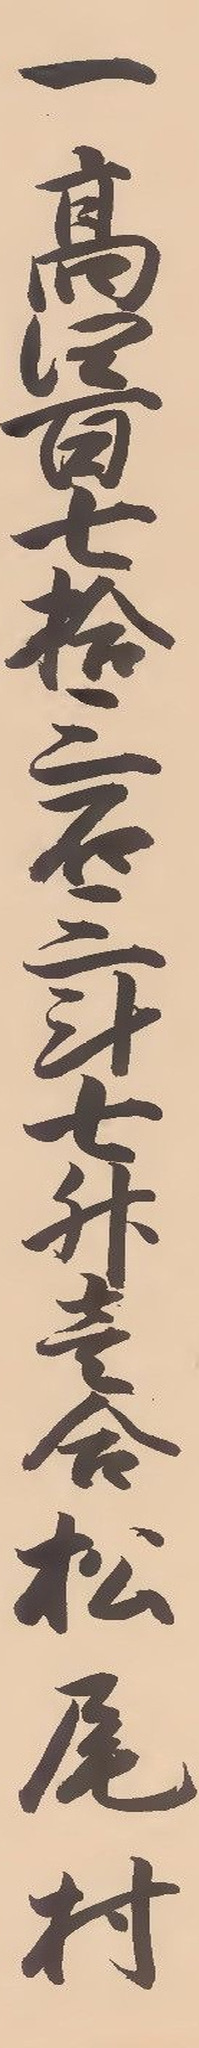一髙四百七拾三石三斗七升壱合松尾村
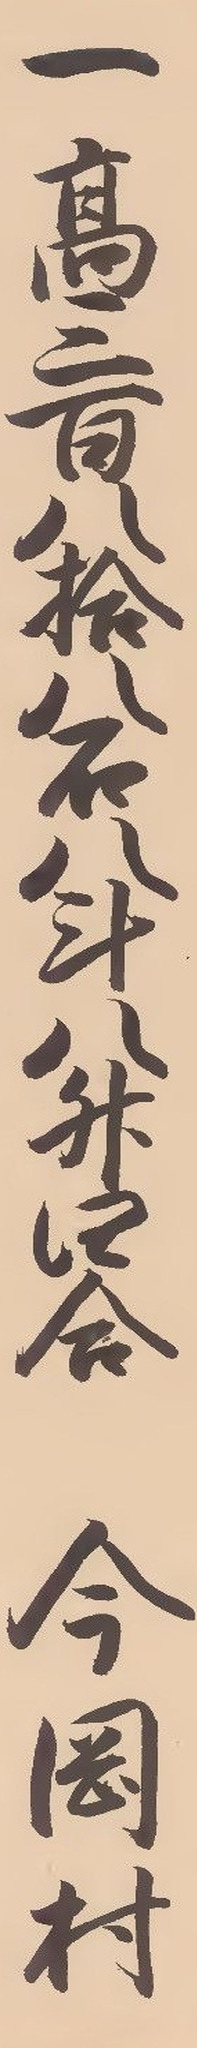一髙三百八拾八石八斗八升四合今岡村
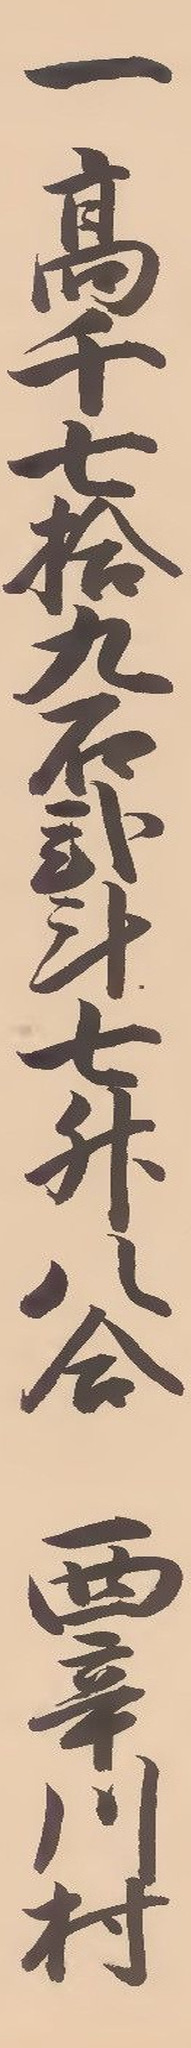一髙千七拾九石弐斗七升八合西辛河村

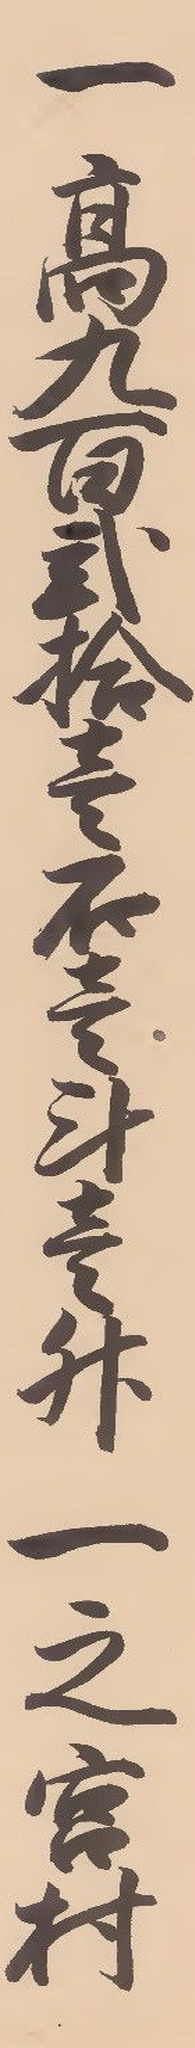一髙九百弐拾壱石壱斗壱升一之宮村
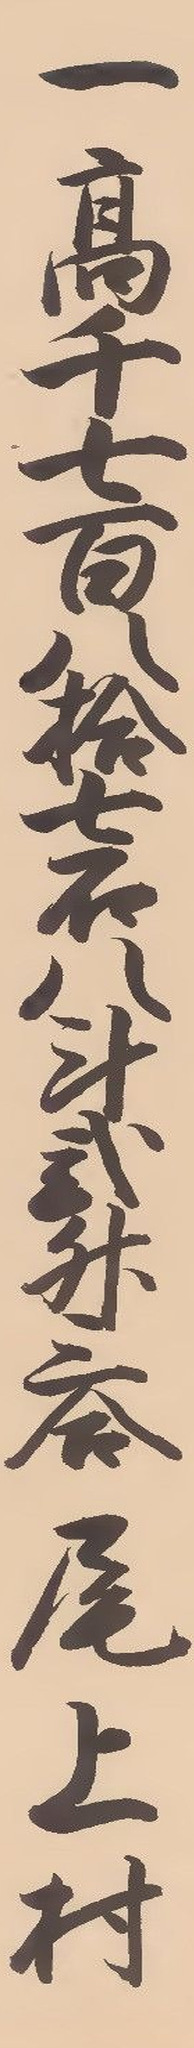一髙千七百八拾七石八斗弐升三合尾上村
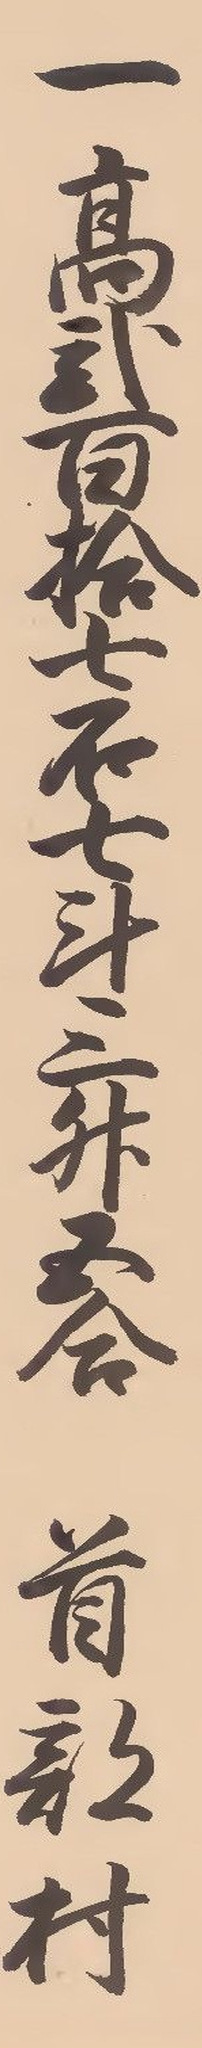一髙弐百拾七石七斗三升五合首部村
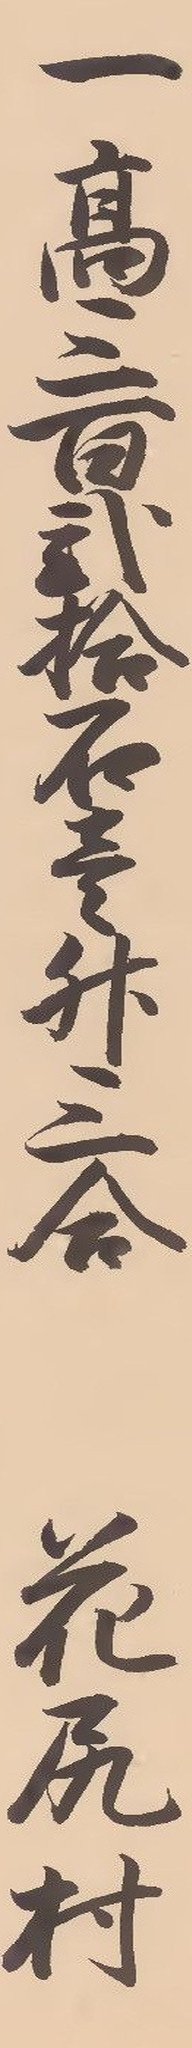一髙三百弐拾石壱升三合花尻村
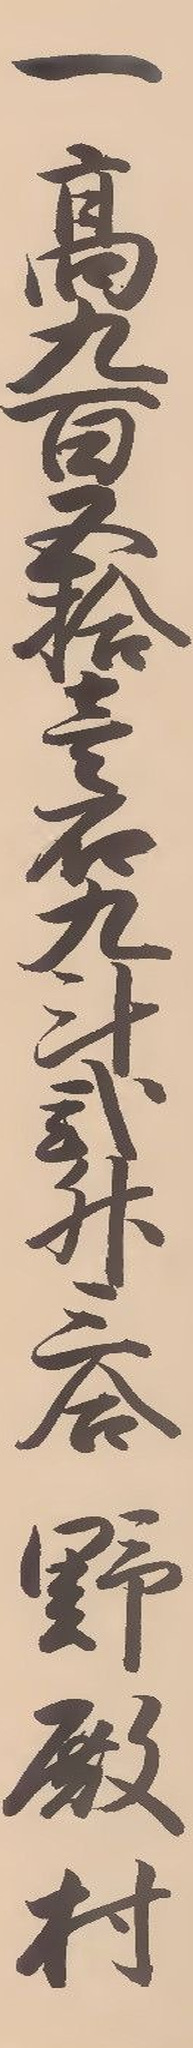一髙九百五拾壱石九斗弐升三合野殿村
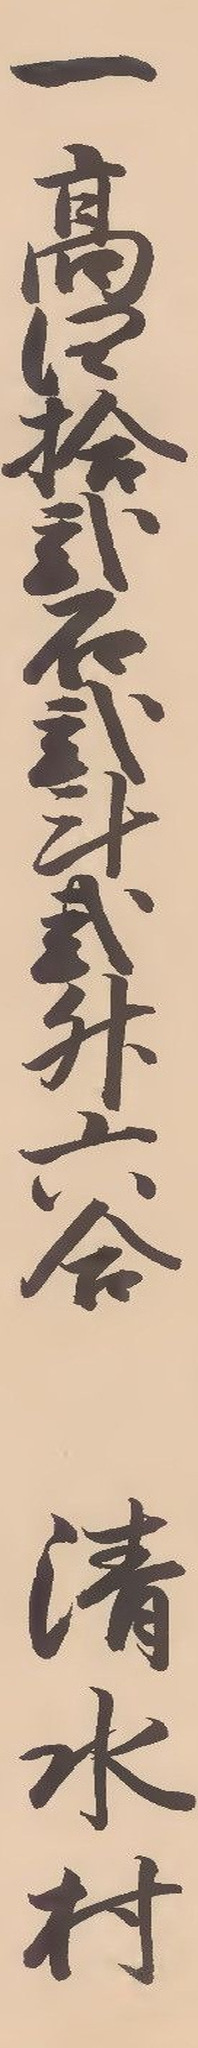一髙四拾弐石弐斗弐升六合清水村
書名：備前国郷帳
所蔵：国立公文書館 National Archives of Japan
